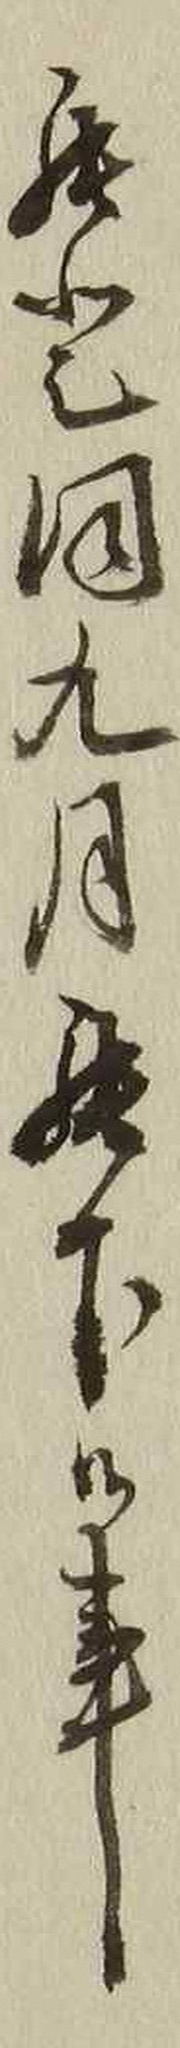罷登同九月罷下候事
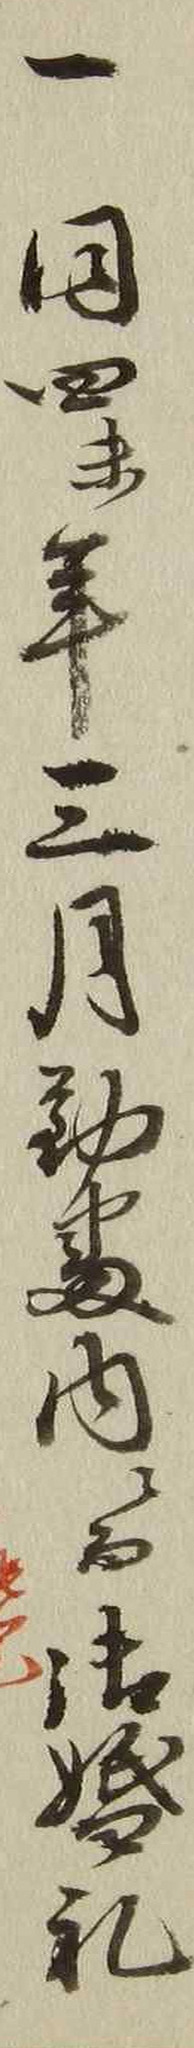一同四未年三月勤番内ニ而御婚礼
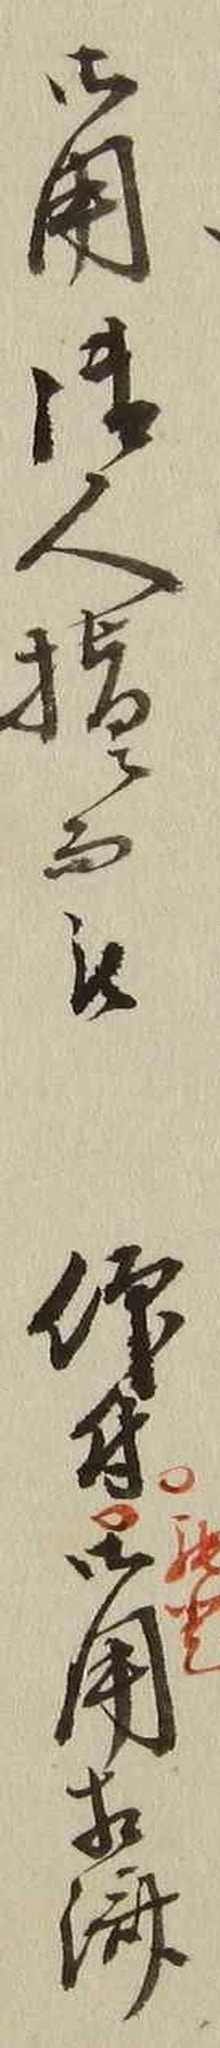御用御人指ニ而被仰付◦御用相済
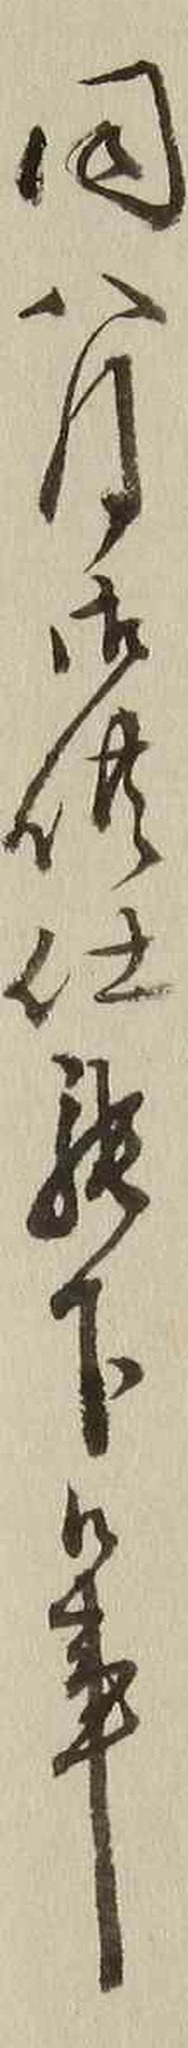同八月御供仕罷下候事
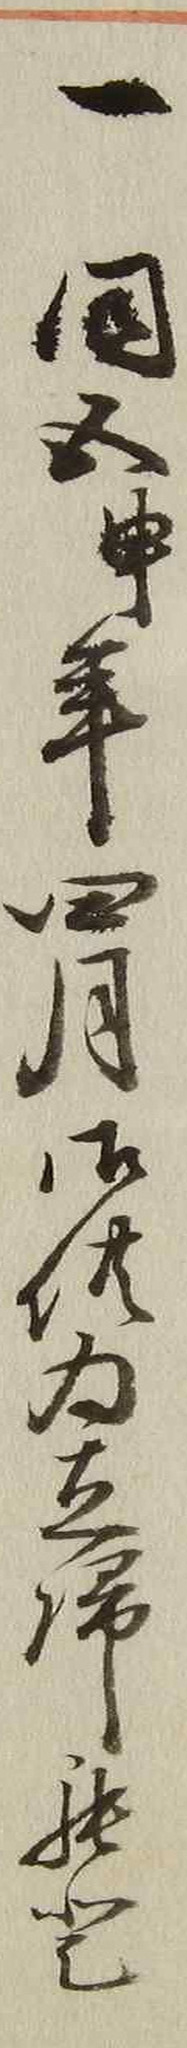一同五申年四月御供為立帰罷登
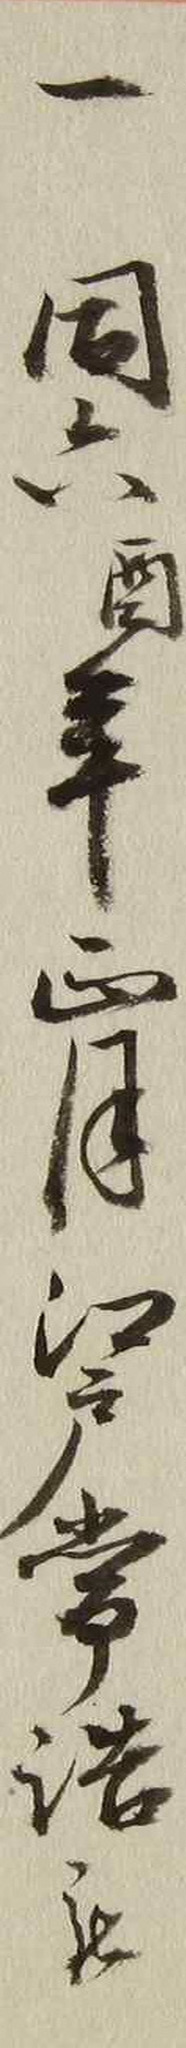一同六酉年正月江戸常詰被
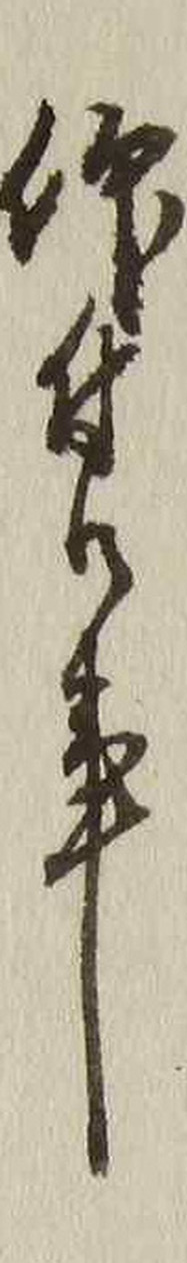仰付候事
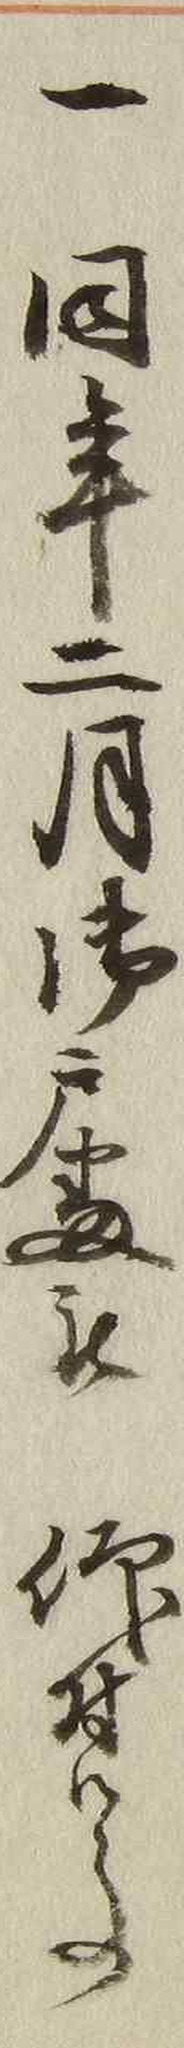一同年二月御戸番被仰付候事
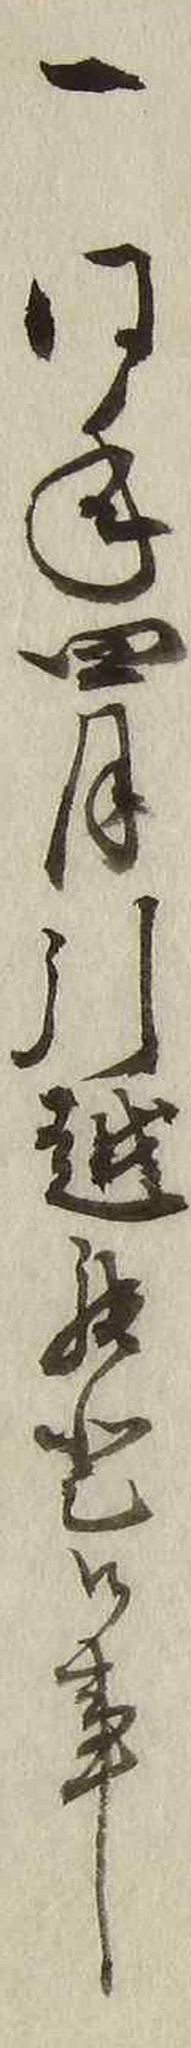一同年四月引越罷登候事
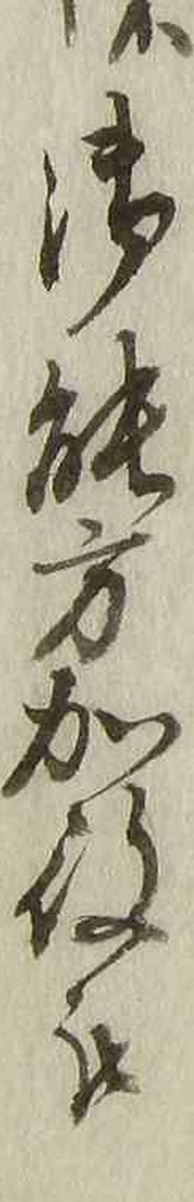詳御能方加役被
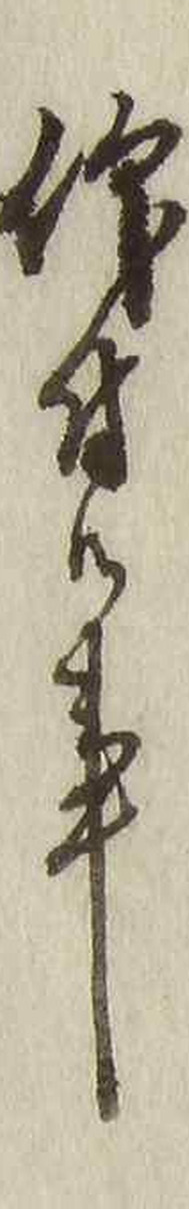仰付候事
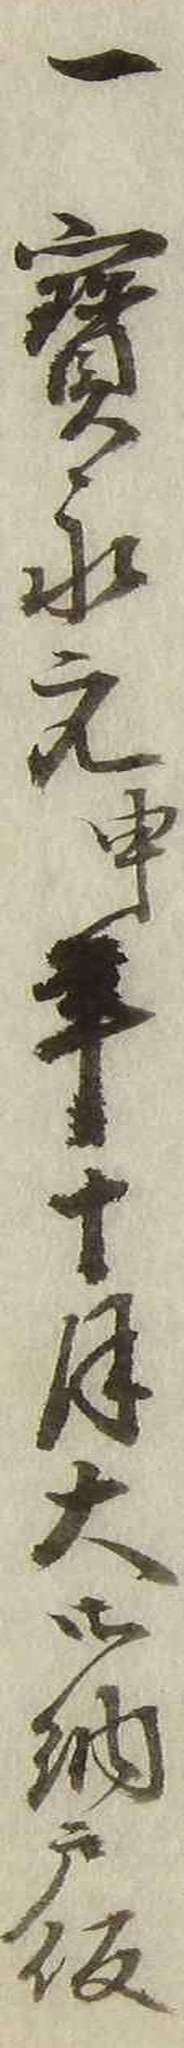一宝永元申年十月大御納戸仮
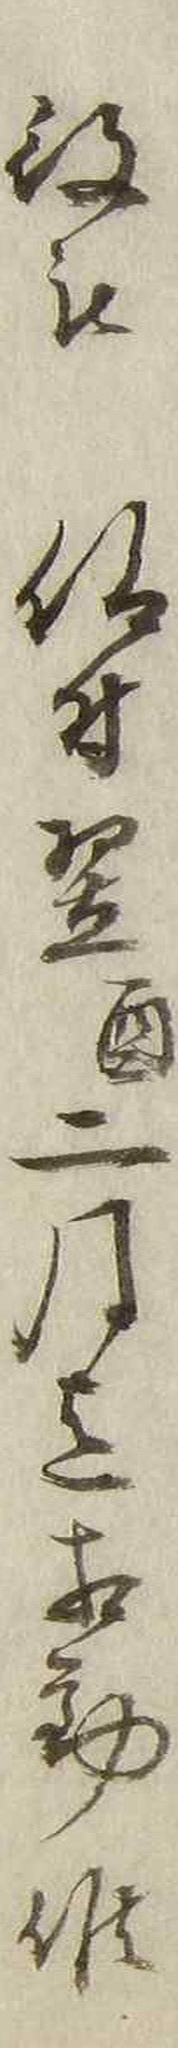役被仰付翌酉二月迄相勤候

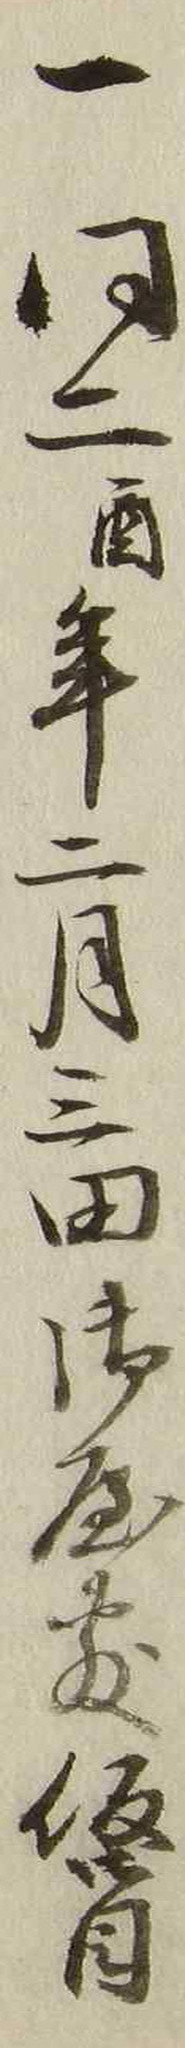一同二酉年二月三田御屋敷仮御目
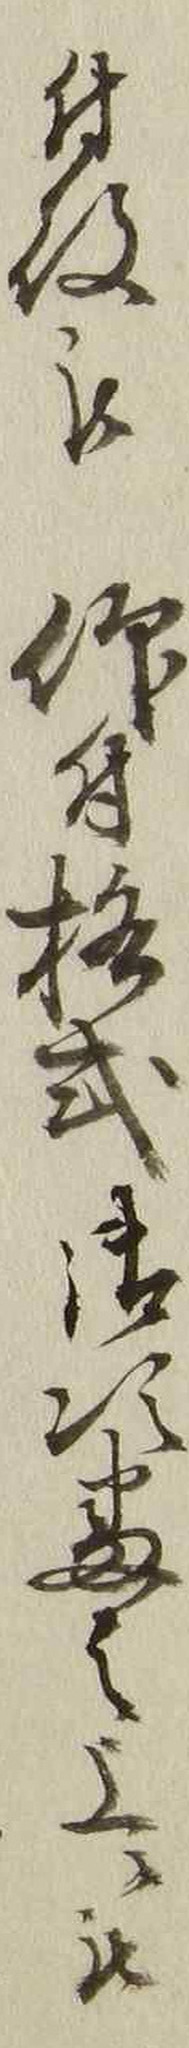付役被仰付格式御次番之上ニ被
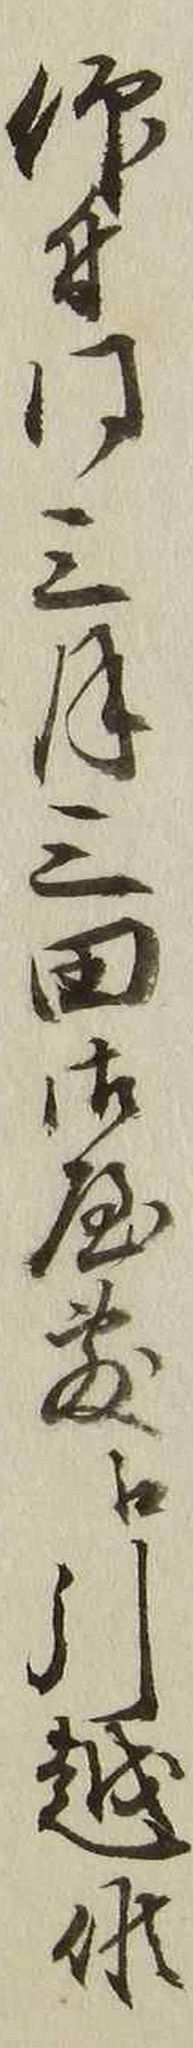仰付同三月三田御屋敷江引越候
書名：諸士系譜　巻之23　い之部23
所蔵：会津若松市立会津図書館
